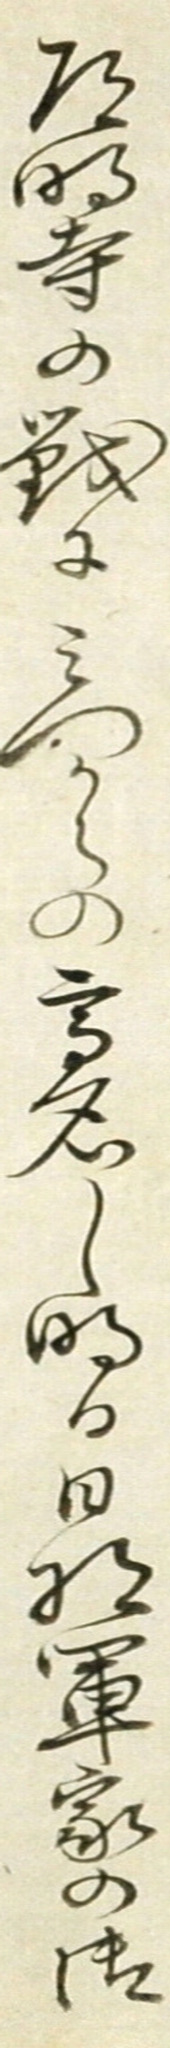道明寺の戦にみつからの高名し明る日将軍家の御
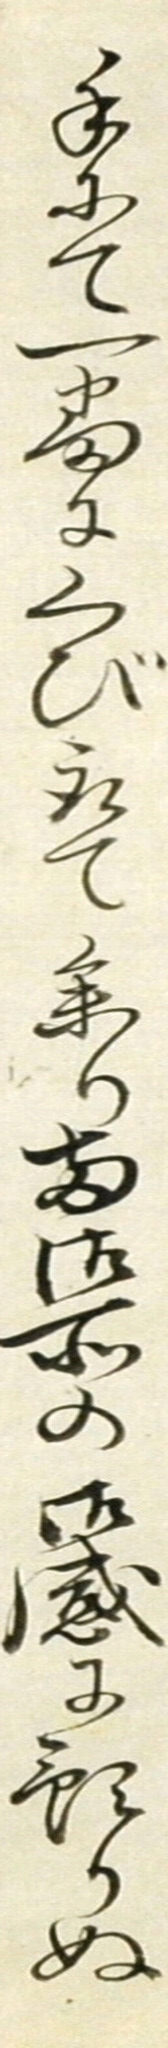手にて一番にくび取て参り両御所の御感に預りぬ
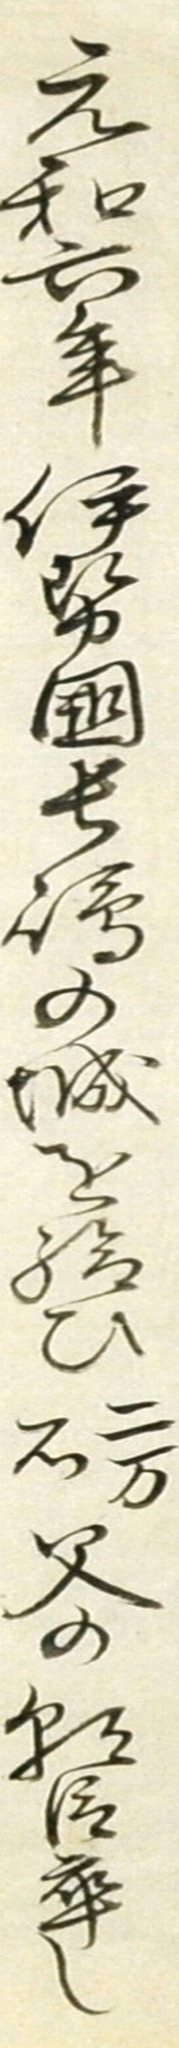元和六年伊勢国長島の城を給ひ二万石父の朝臣卒し
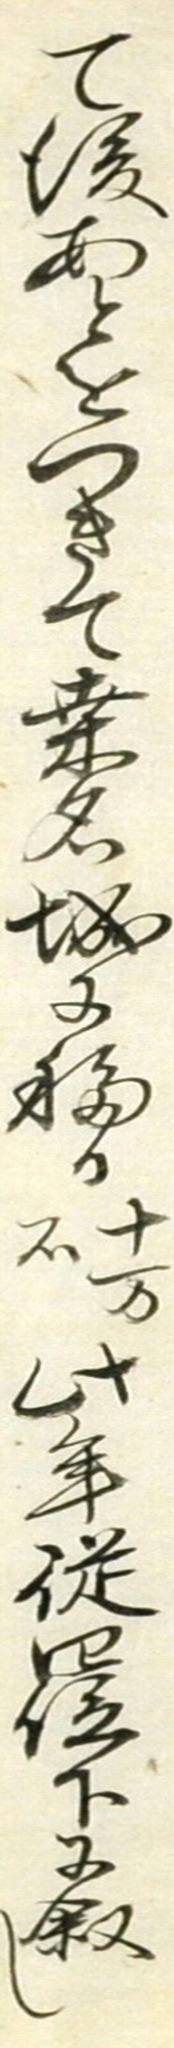て後あとをつきて桑名城に移る十万石此年従四位下に叙し
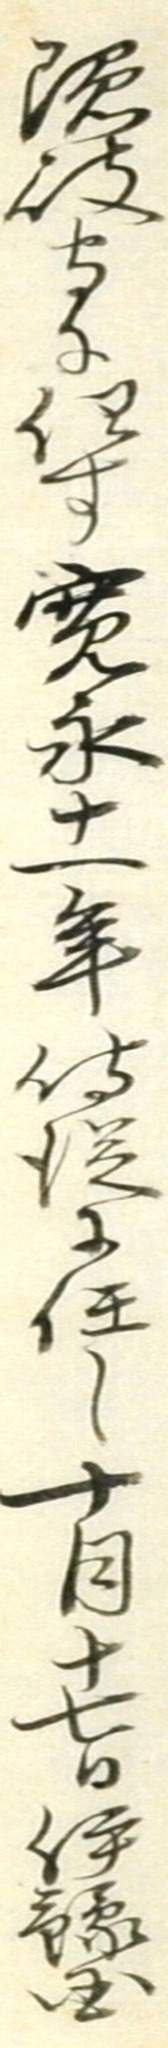隠岐守に任す寛永十一年侍従に任し十月十七日伊予国
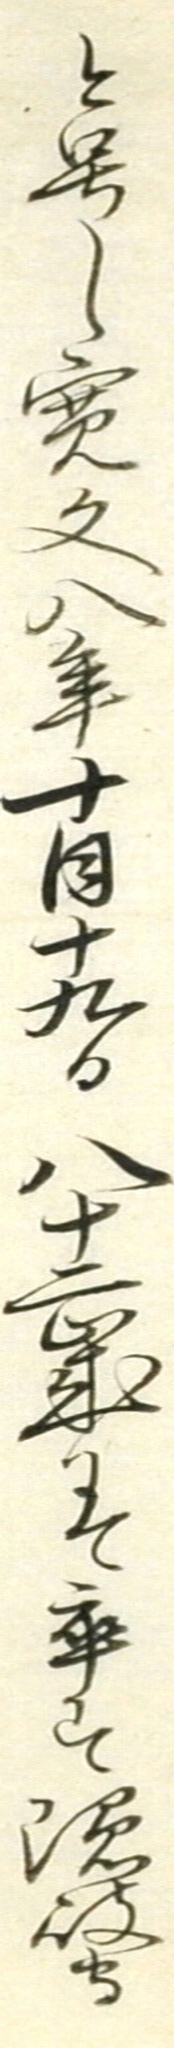と号し寛文八年十月十九日八十二歳にて卒す隠岐守
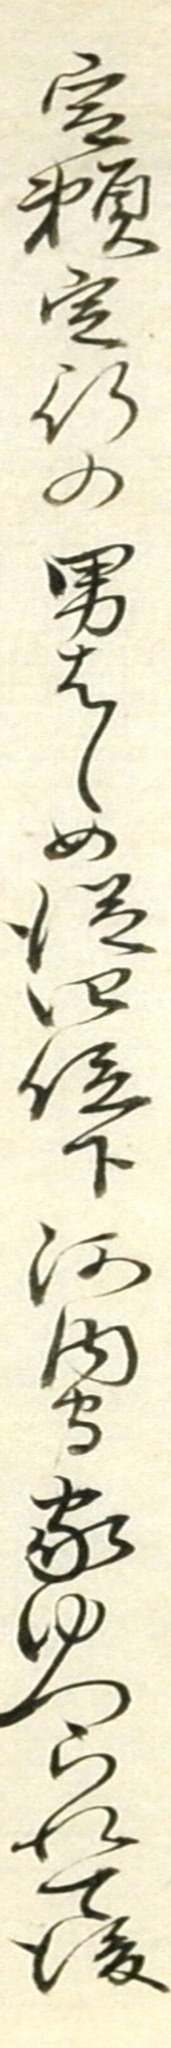定頼定行の男はしめ従四位下河内守家ゆつられて後
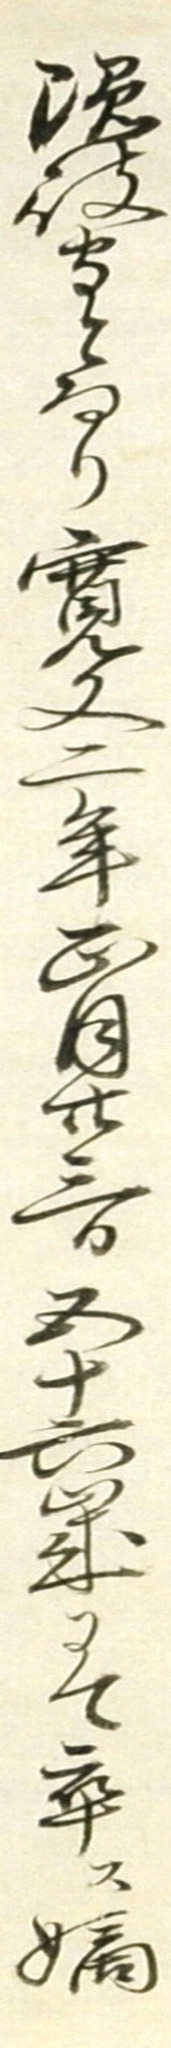隠岐守となり寛文二年正月廿三日五十六歳にて卒嫡
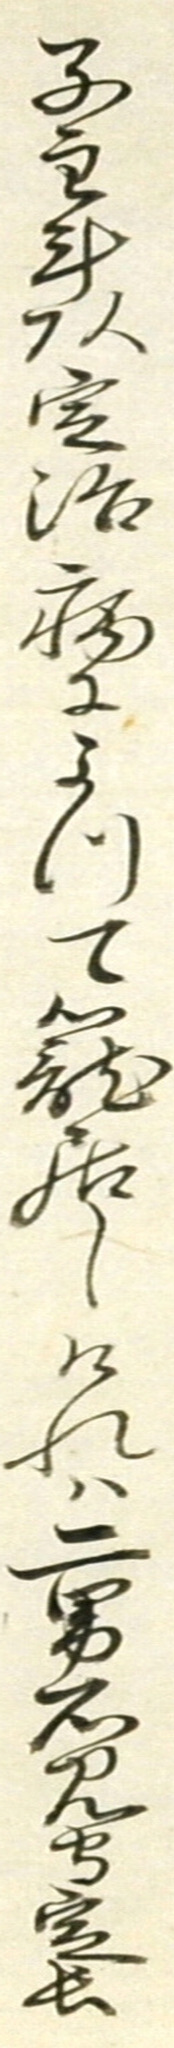子主計頭定治病によつて籠居しけれは二男石見守定長
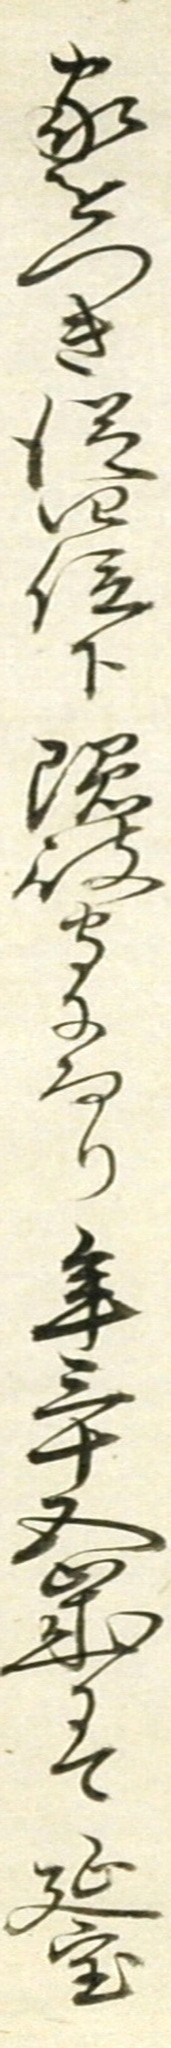家をつき従四位下隠岐守になり年三十五歳にて延宝
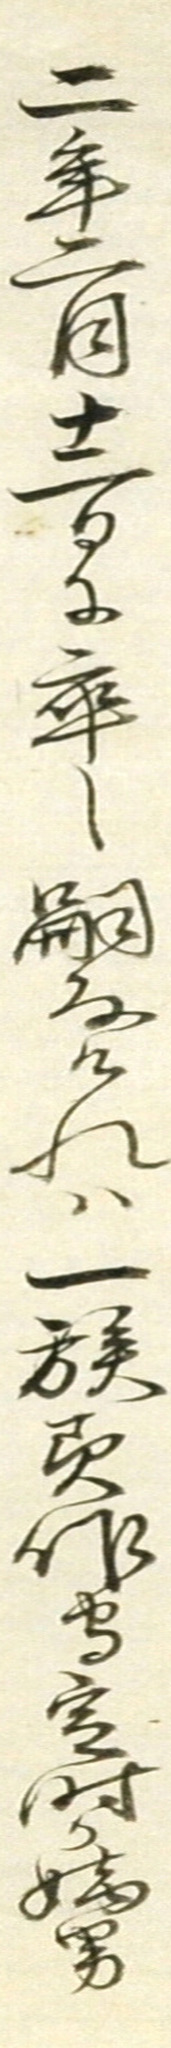二年二月十二日に卒し嗣なけれは一族美作守定時か嫡男
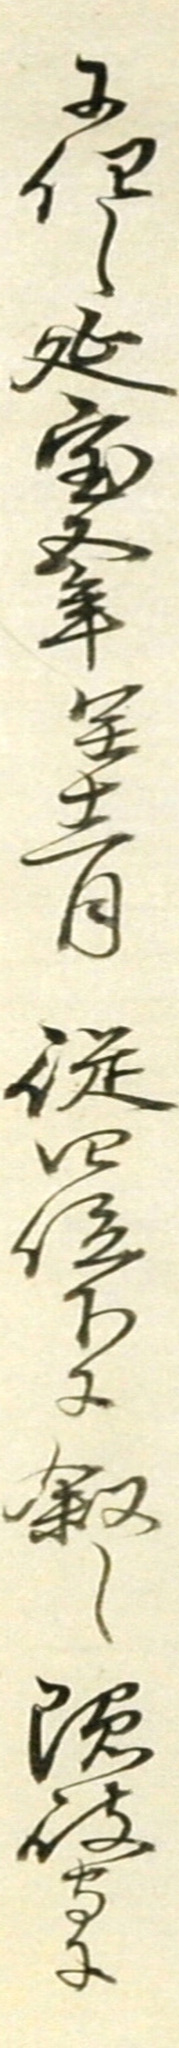に任し延宝五年閏十二月従四位下に叙し隠岐守に

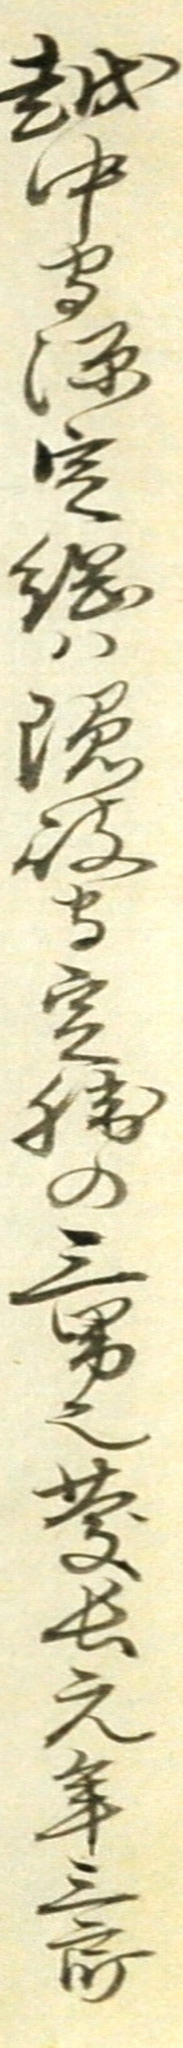越中守源定綱は隠岐守定勝の三男也慶長元年三郎
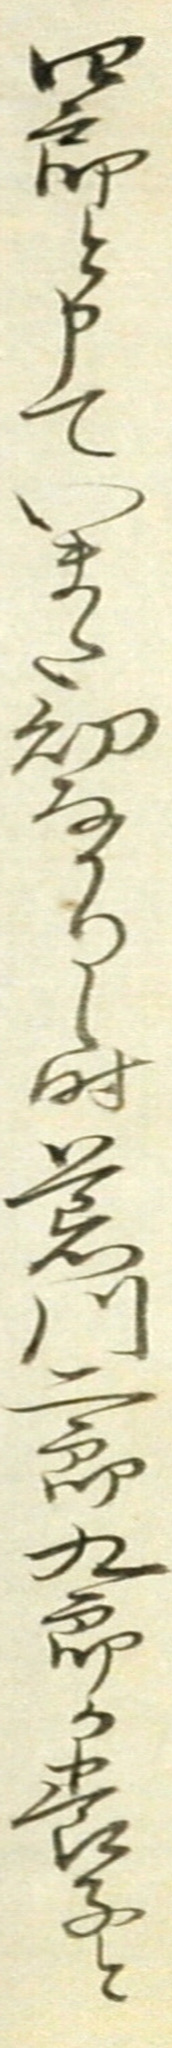四郎と申ていまた幼なかりし時荒川二郎九郎か養子と
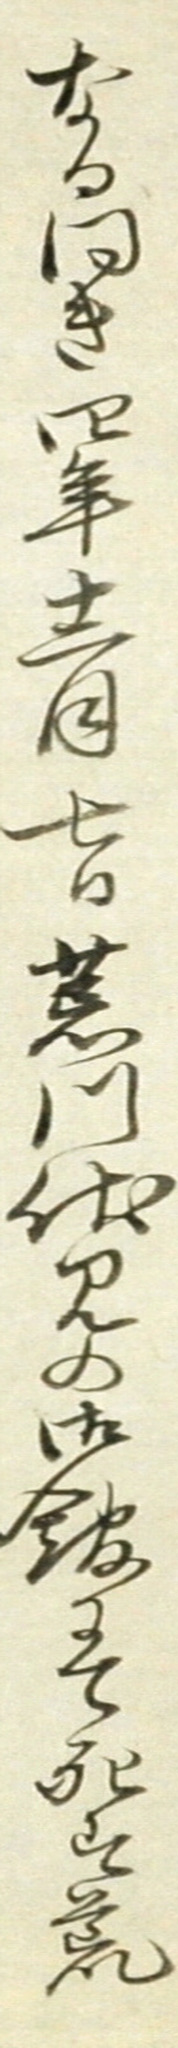なる同き四年十二月七日荒川伏見の御館にて死す荒
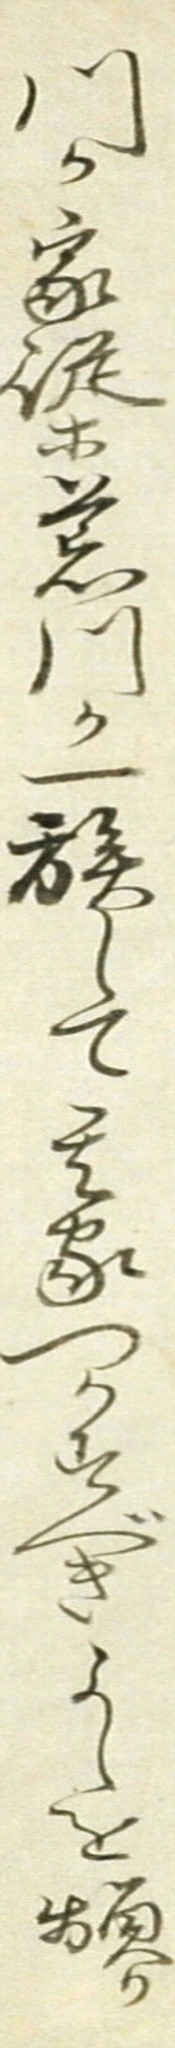川か家従等荒川か一族して其家つかすべきよしを頻り
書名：藩翰譜（二・三）
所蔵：伊那市立高遠町図書館・合同会社AMANE
